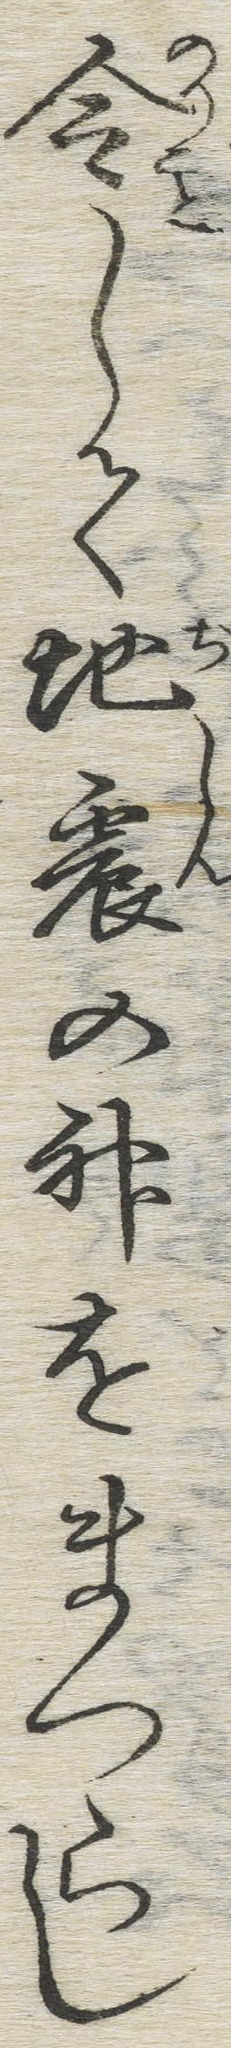令して地震の神をまつらし
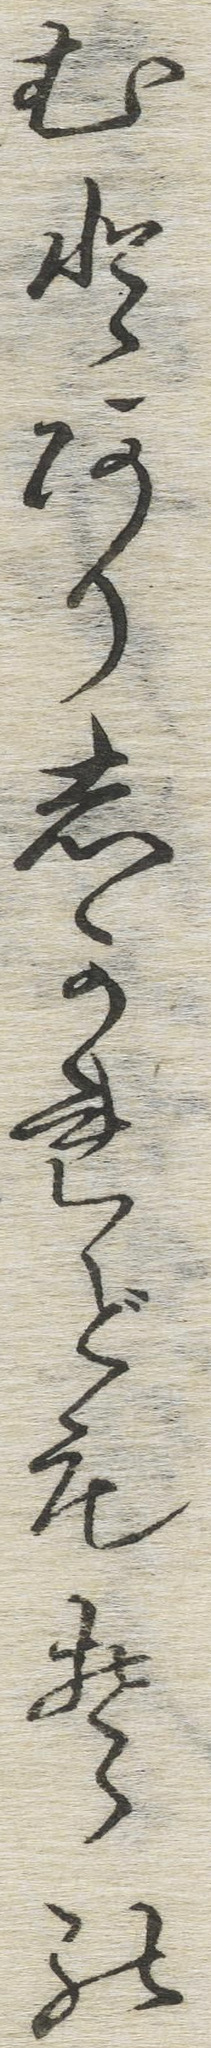むとなりしかれどもその
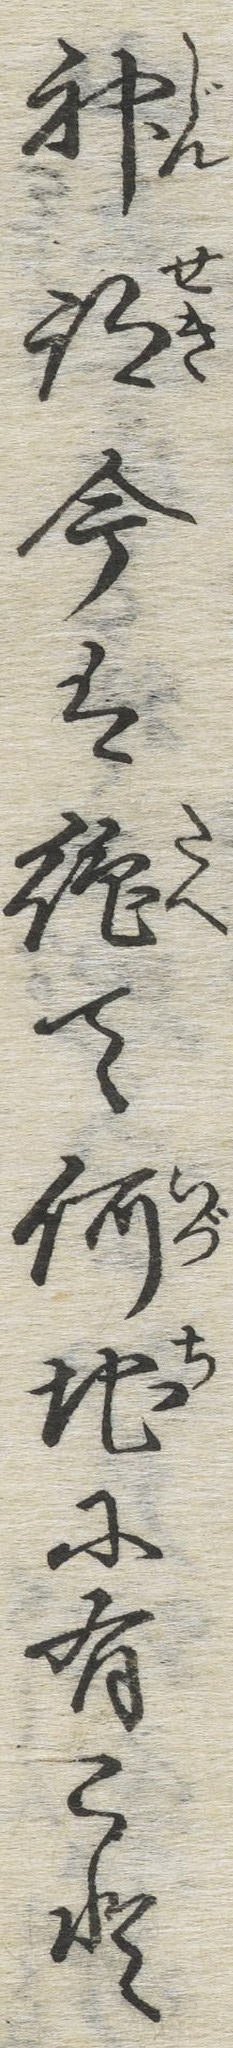神跡今は絶て何地に有こと
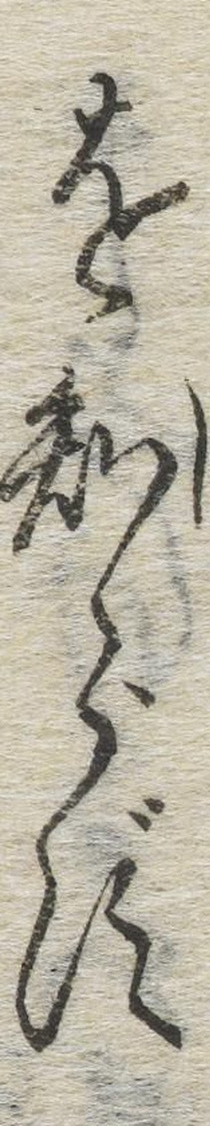を知らず
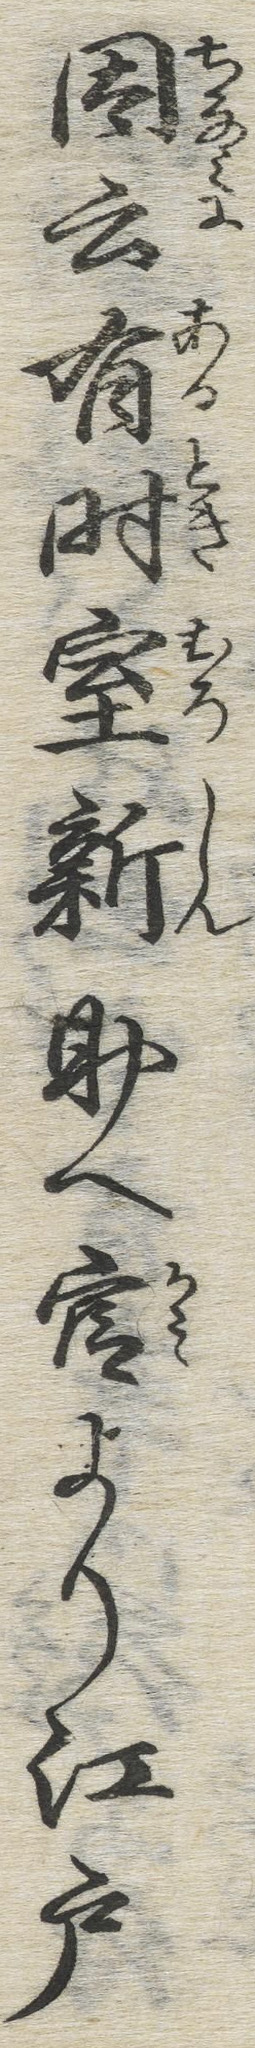因云有時室新助へ宮より江戸

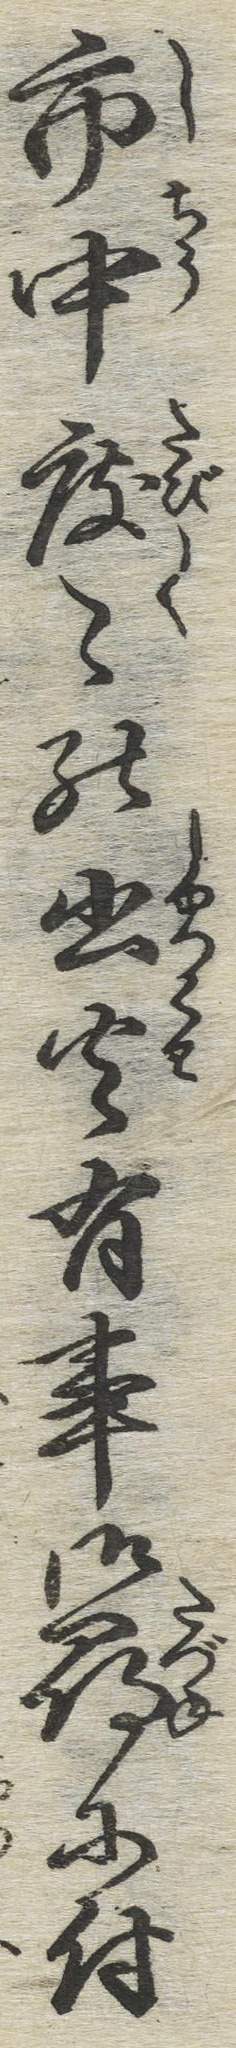市中度々の出火有事御尋に付
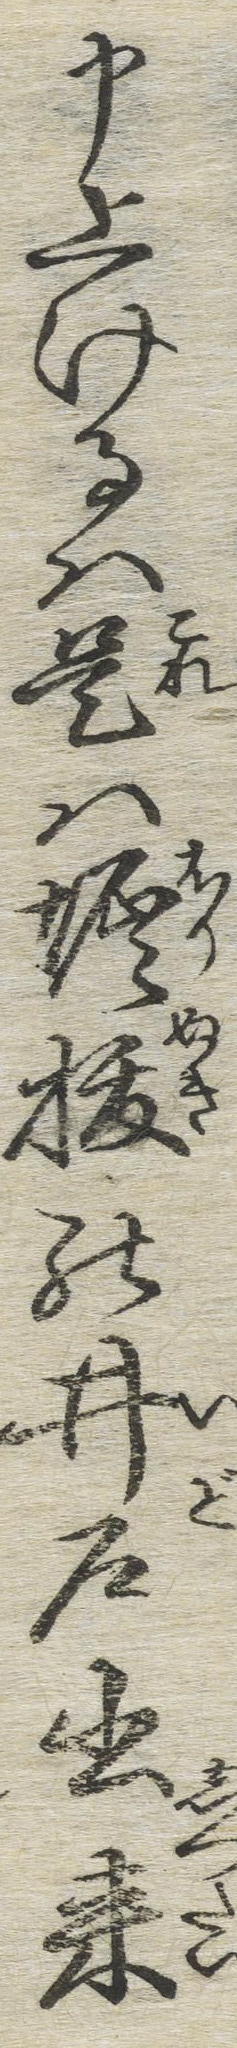申上けるは是は堀抜の井戸出来
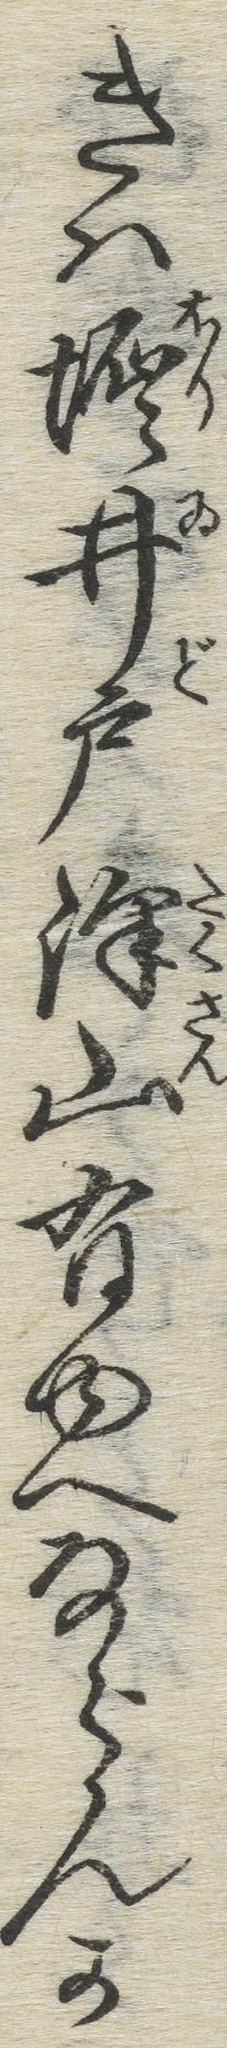きは堀井戸沢山有ゆへならんか
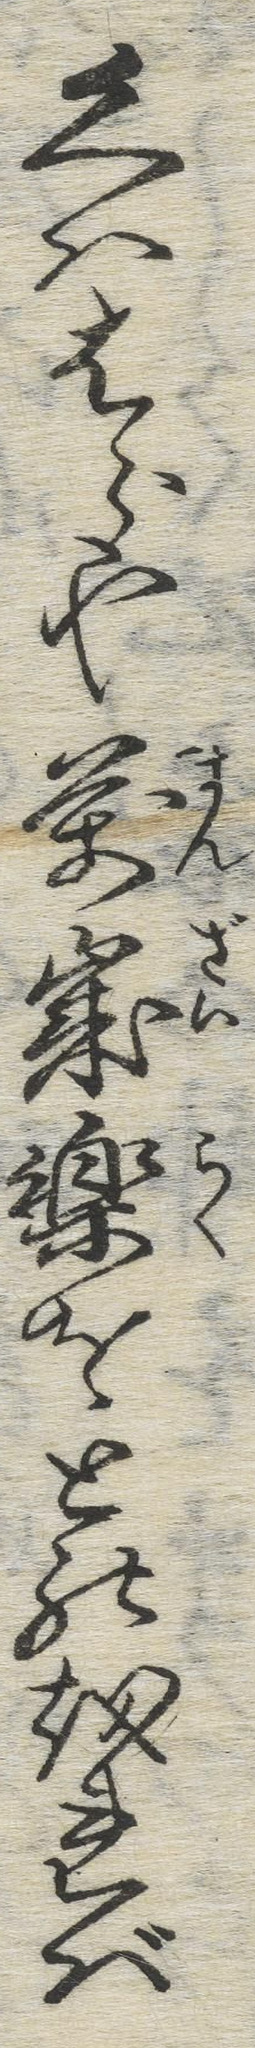くははらや万歳楽をとのふれば
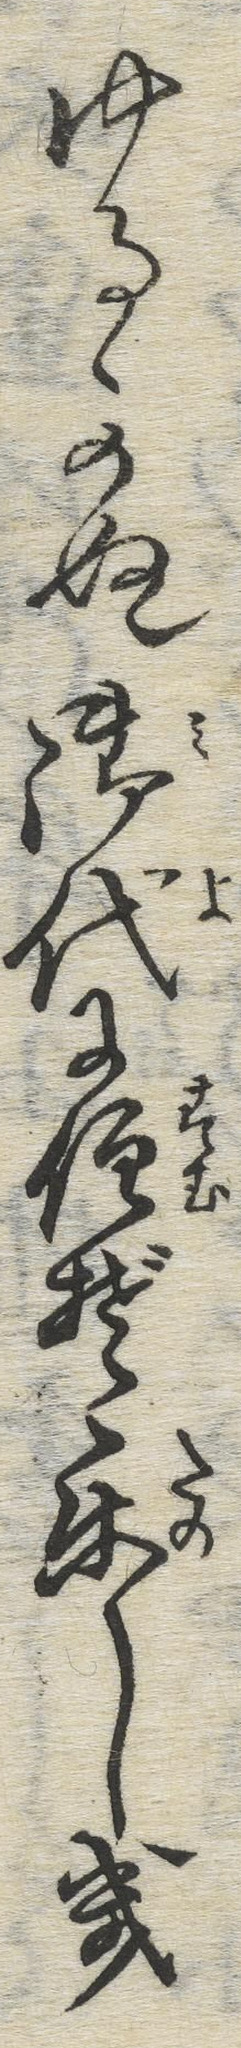ゆるかぬ御代に住ぞ楽しき
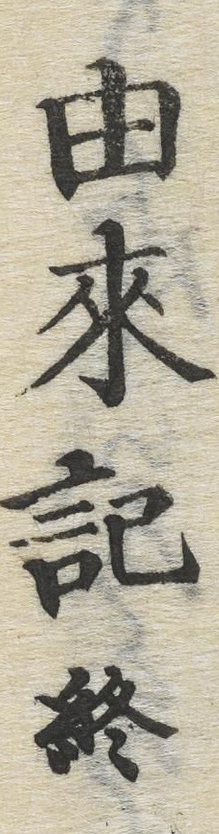由来記終
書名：雷公地震由來記　全
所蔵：東京大学地震研究所図書室 Earthquake Research Institute Library, The University of Tokyo, JAPAN
